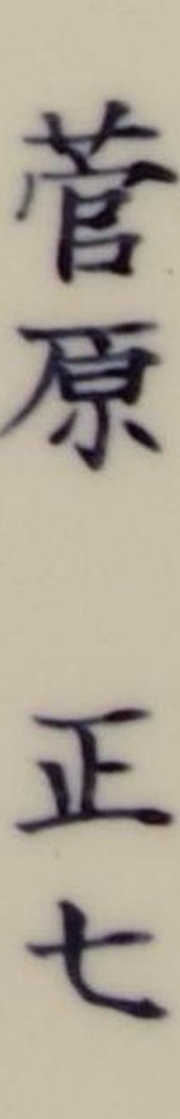菅原正七
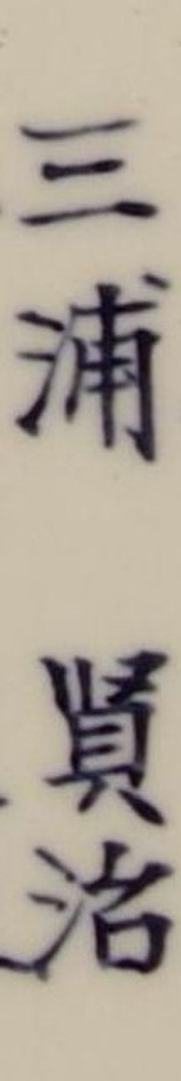三浦賀治
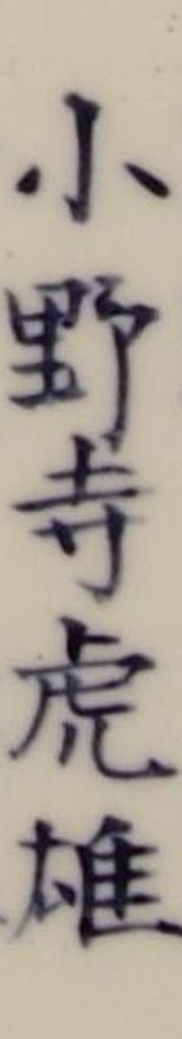小野寺虎雄
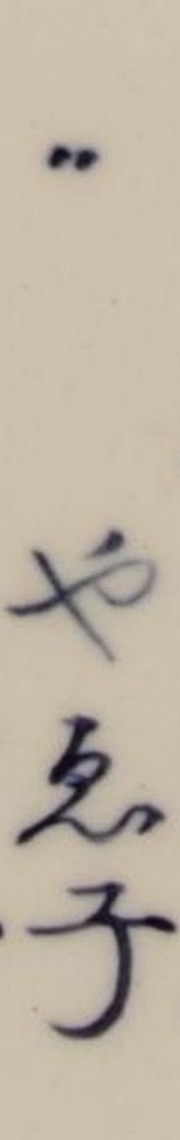やゑ子
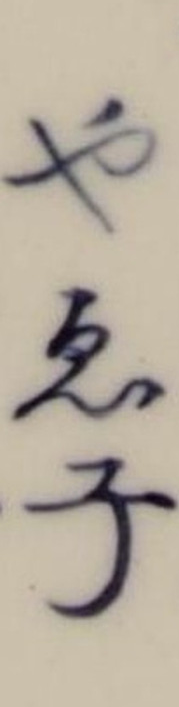やゑ子
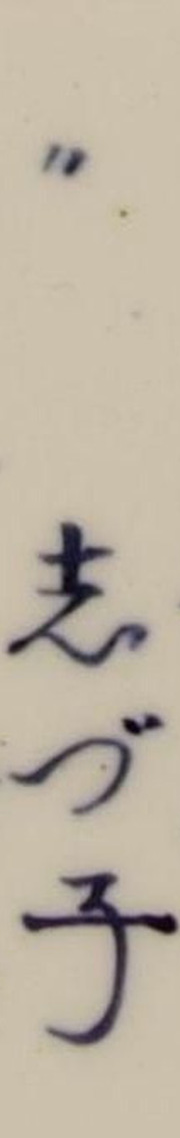しづ子
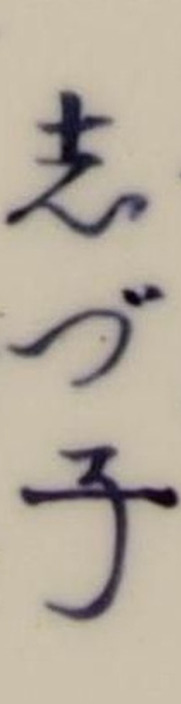しづ子
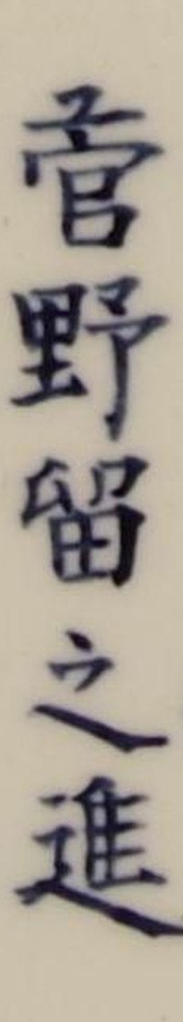菅野留之進
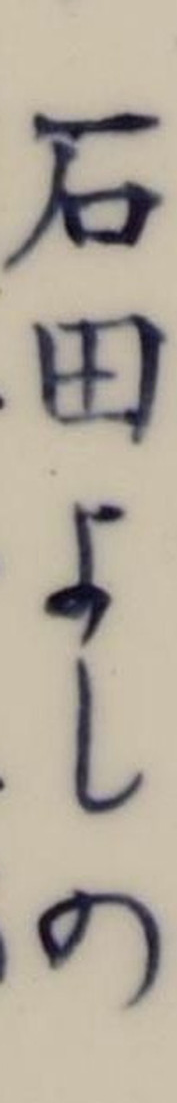石田よしの
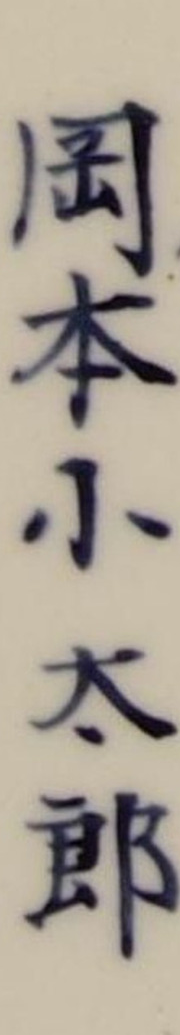岡本小太郎
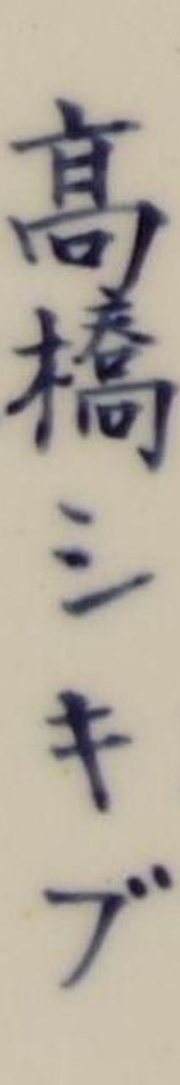高橋シキブ
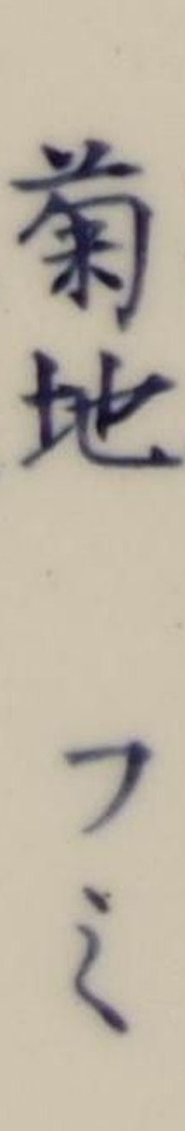菊地フミ

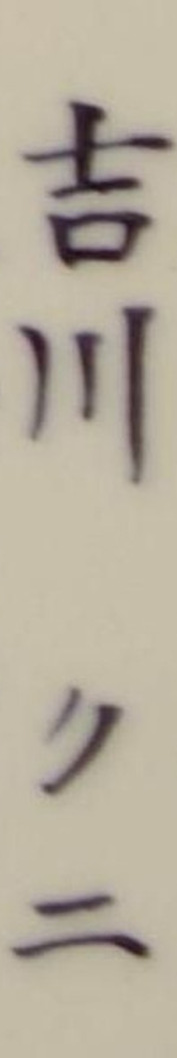吉川クニ
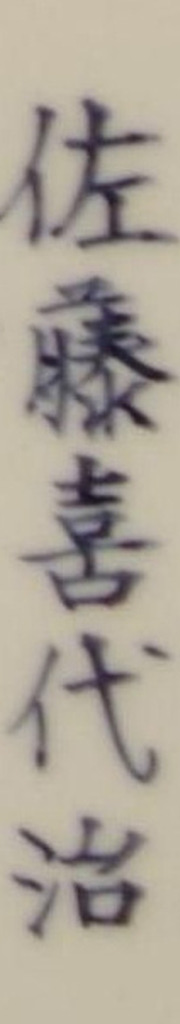佐藤喜代治
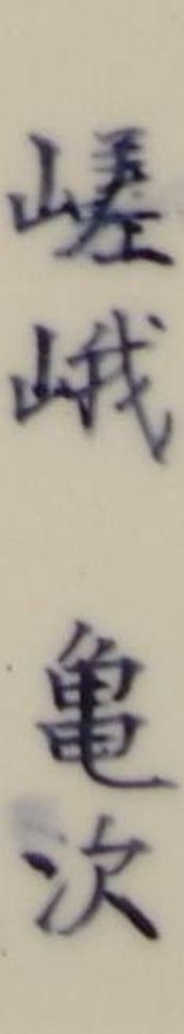嵯峨亀次
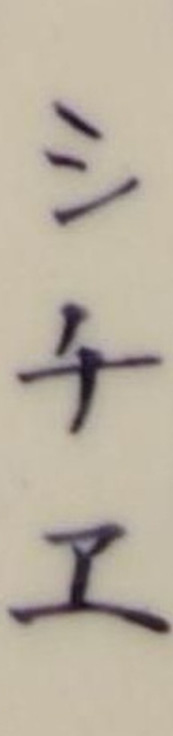シチヱ
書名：E~L
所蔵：高野山金剛峯寺
